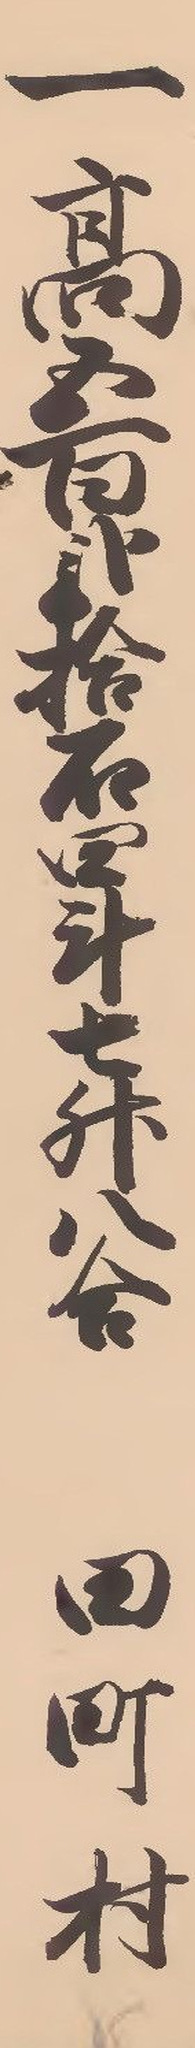一高五百弐拾石四斗七升八合田町村
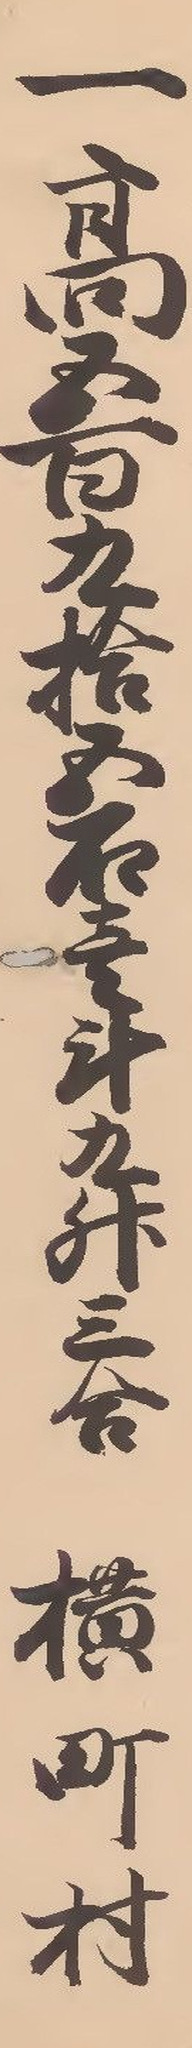一高五百九拾五石壱斗九升三合横町村

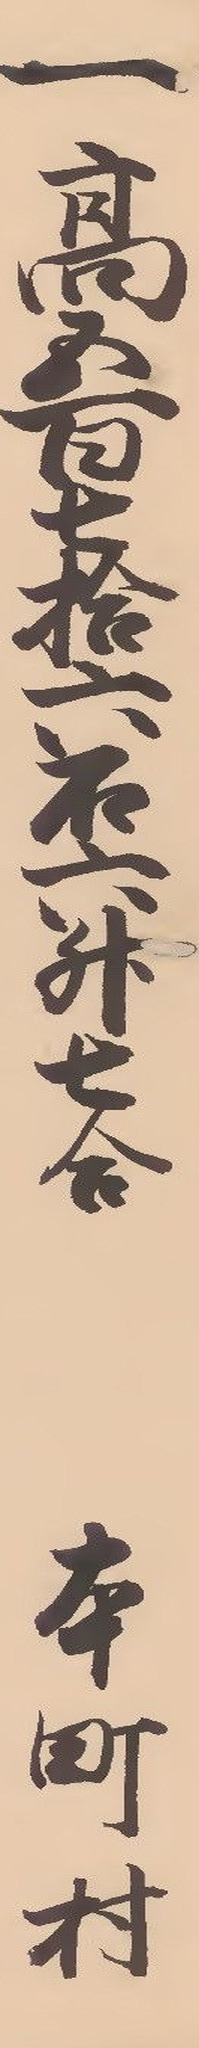一高五百七拾六石六升七合本町村
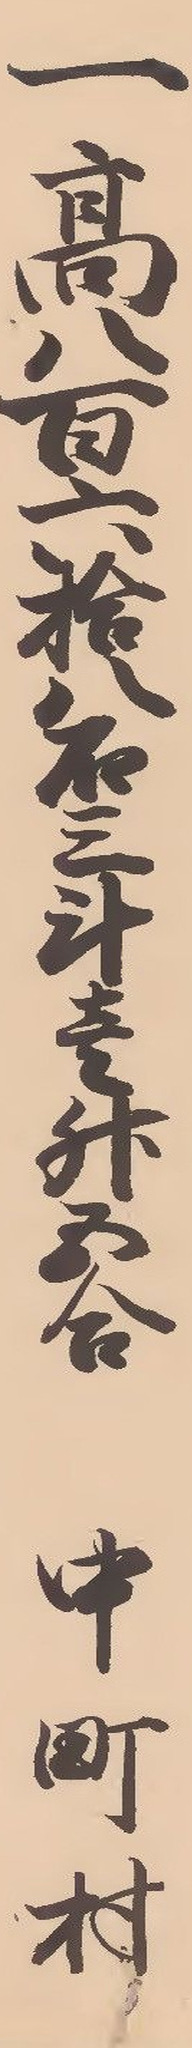一高八百六拾八石三斗壱升五合中町村
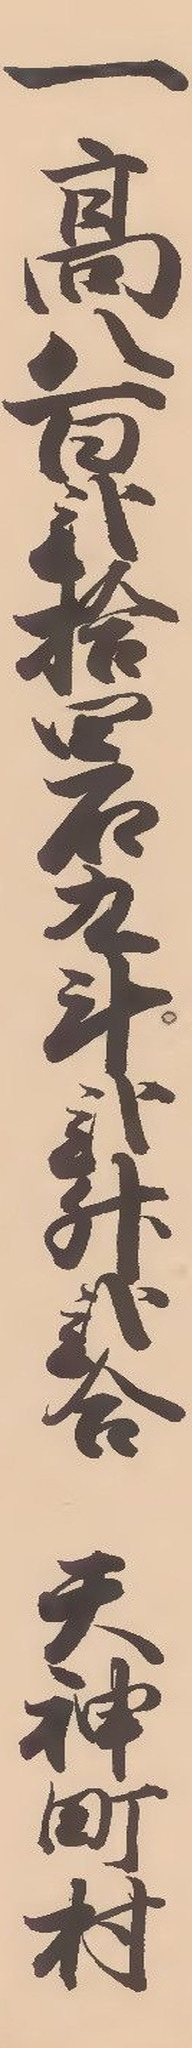一高八百弐拾四石九斗弐升弐合天神町村
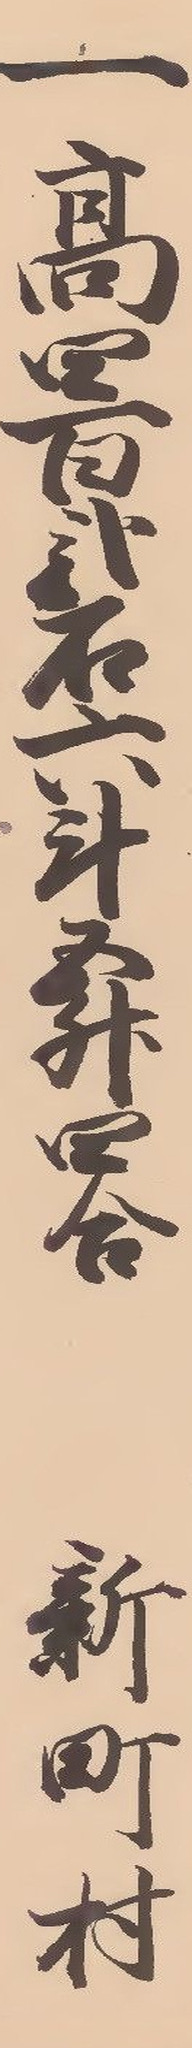一高四百弐石六斗五升四合新町村
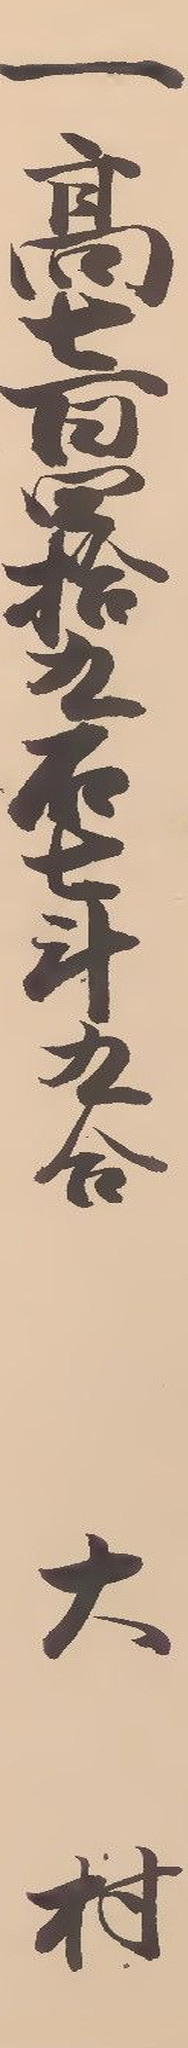一高七百四拾九石七斗九合大村
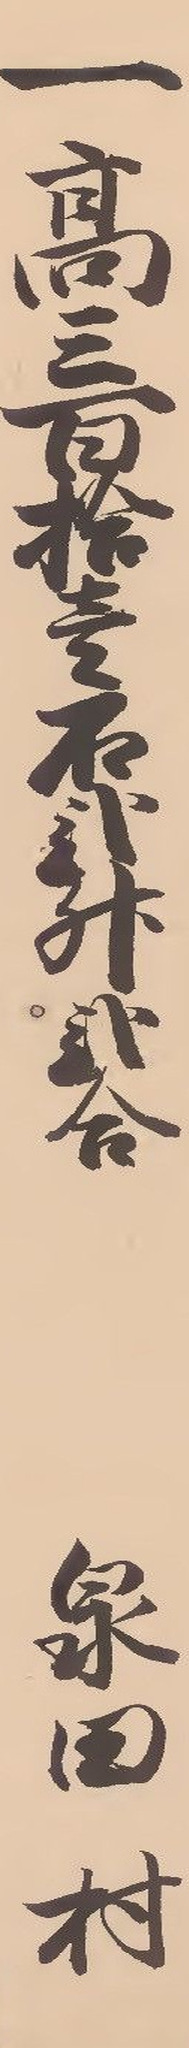一高三百拾壱石弐升弐合泉田村
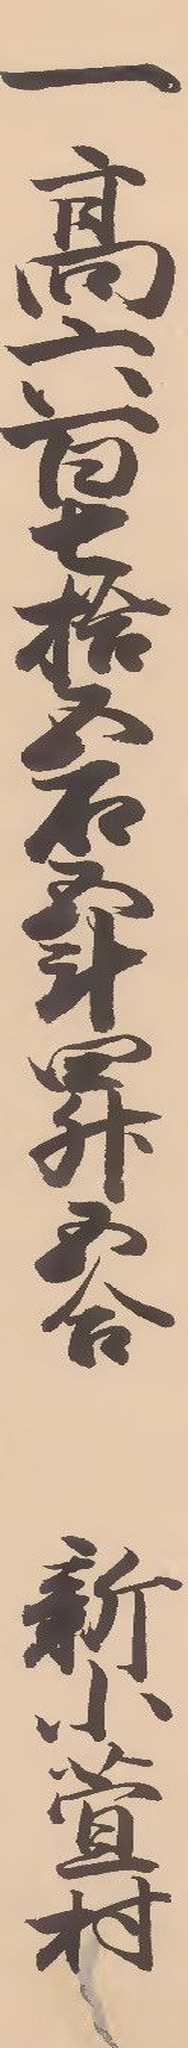一高六百七拾五石五斗四升五合新小萱村
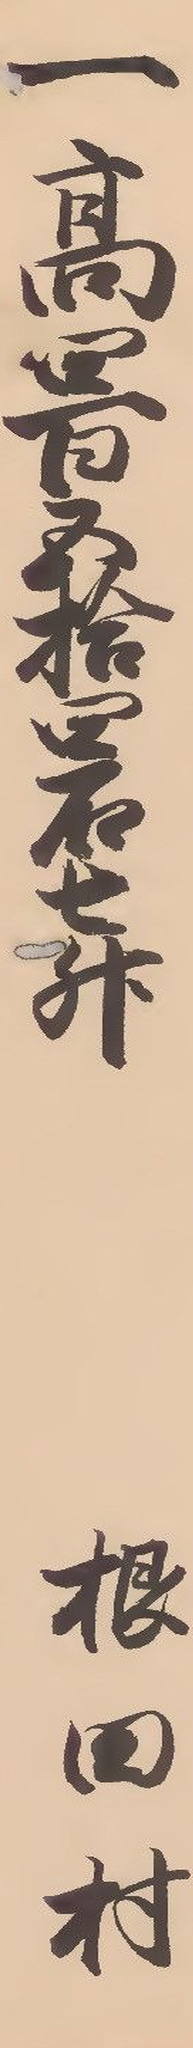一高四百五拾四石七升根田村

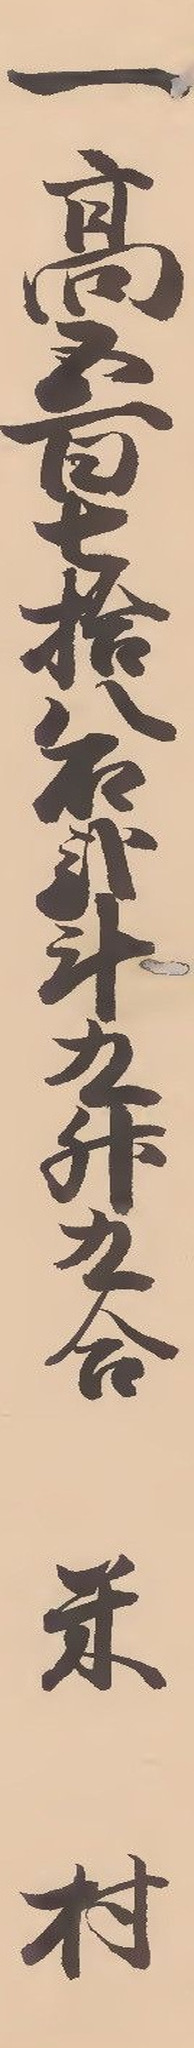一高五百七拾八石弐斗九升九合米村
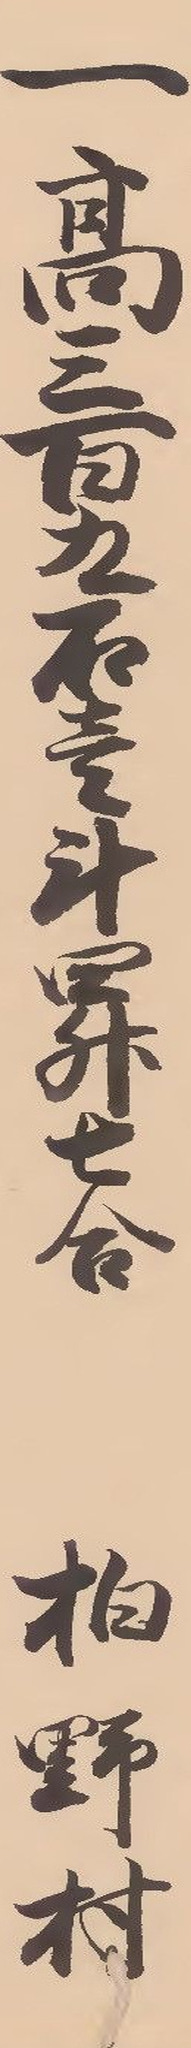一高三百九石壱斗四升七合柏野村
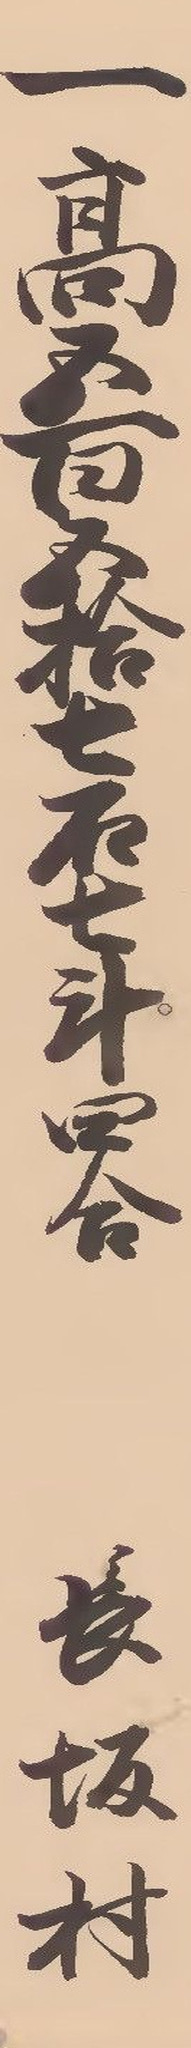一高五百五拾七石七斗四合長坂村
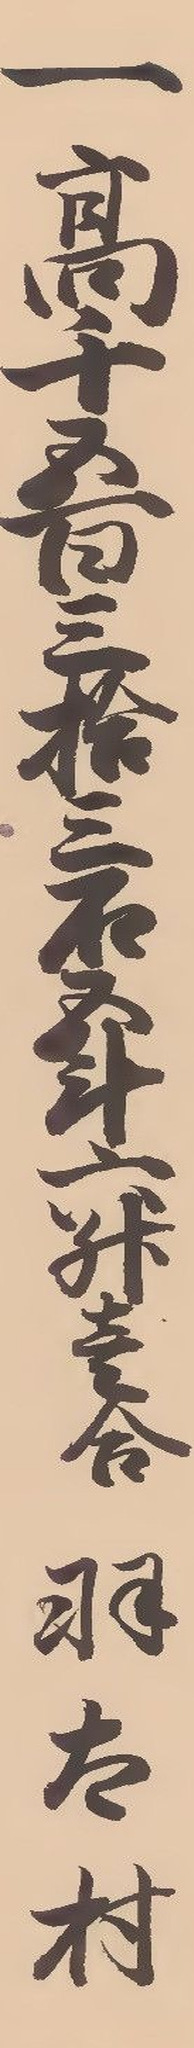一高千五百三拾三石五斗六升壱合羽太村
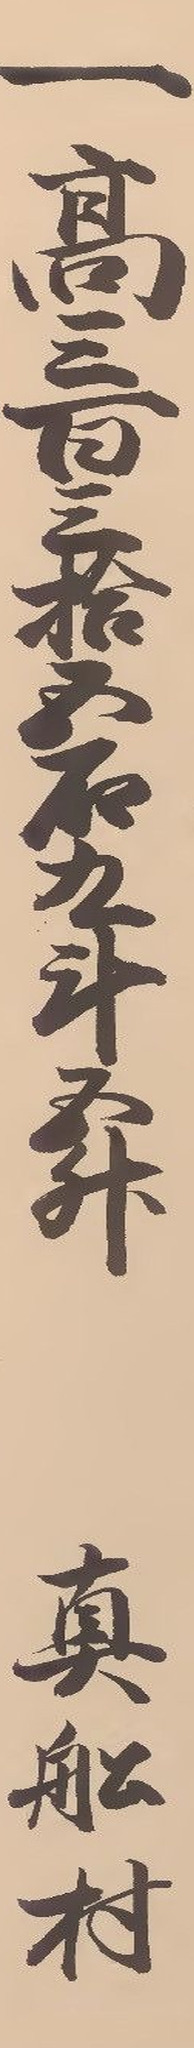一高三百三拾五石九斗五升真船村
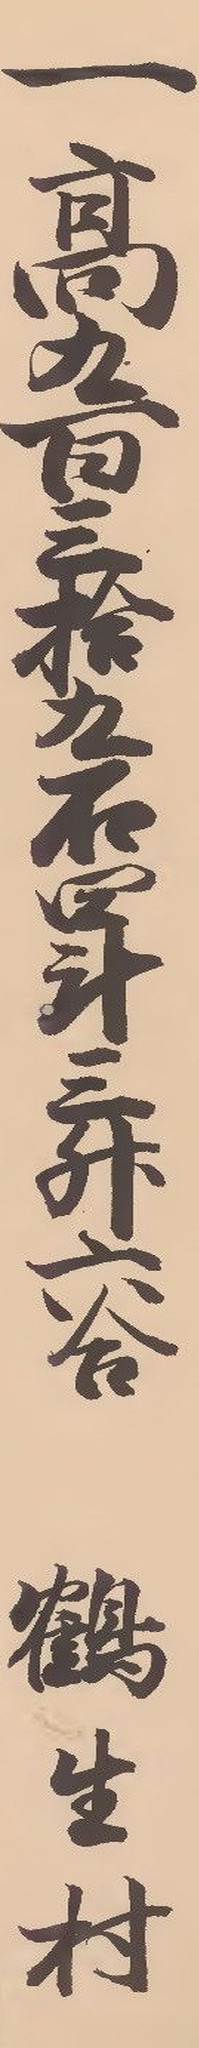一高九百三拾九石四斗三升六合鶴生村
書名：陸奥国郷帳　２
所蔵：国立公文書館 National Archives of Japan
